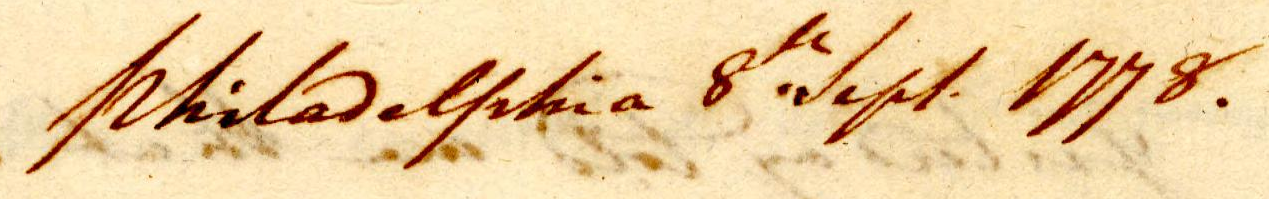Philadelphia 8^th Sept. 1778.
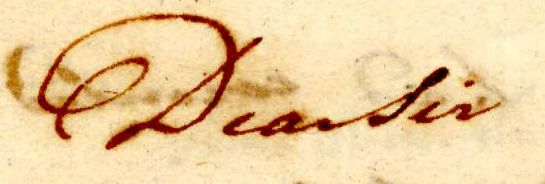Dear Sir
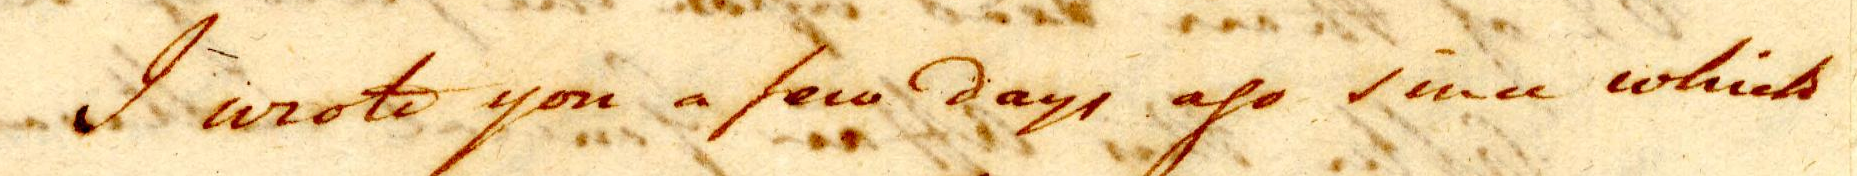I wrote you a few days ago since which
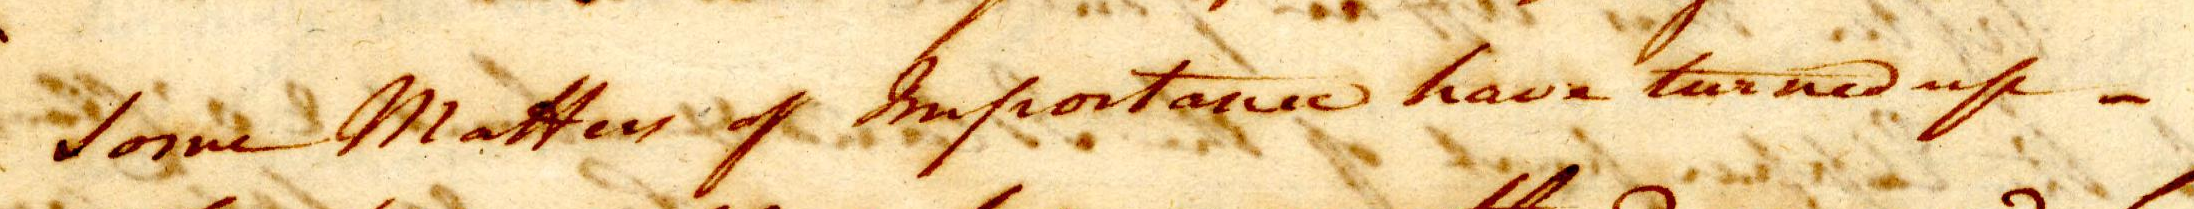some Matters of Importance have turned up.
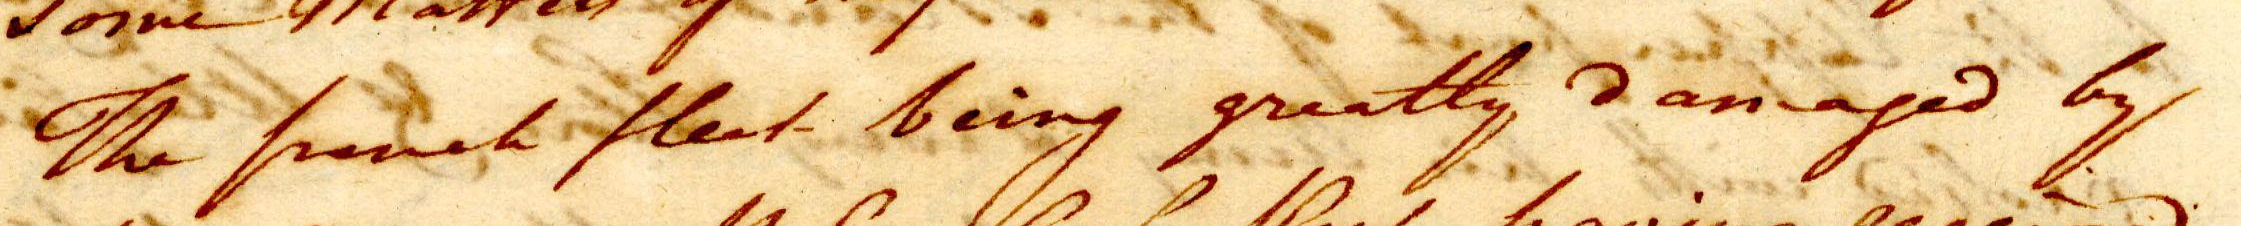The French fleet being greatly damaged by
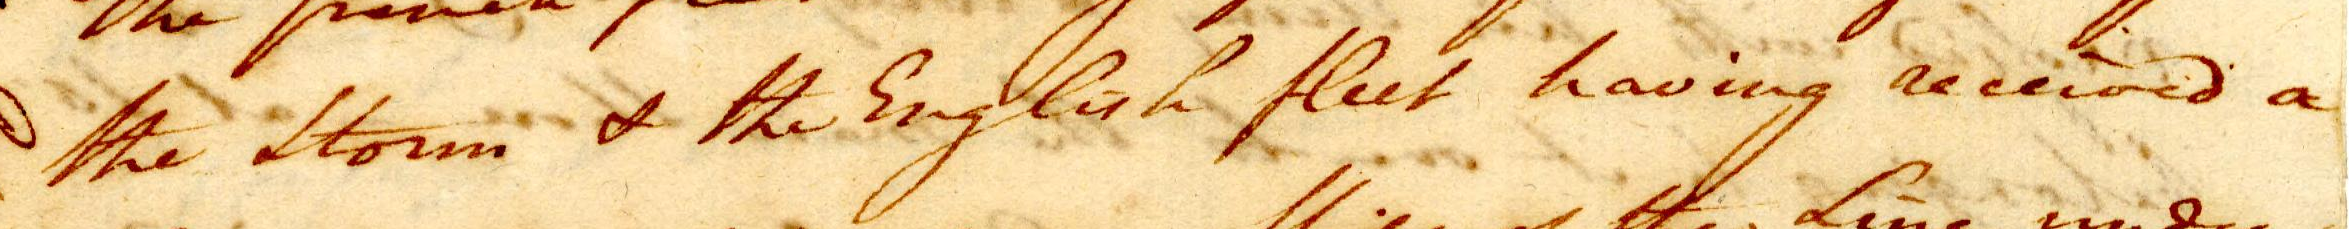the Storm & the English fleet having received a
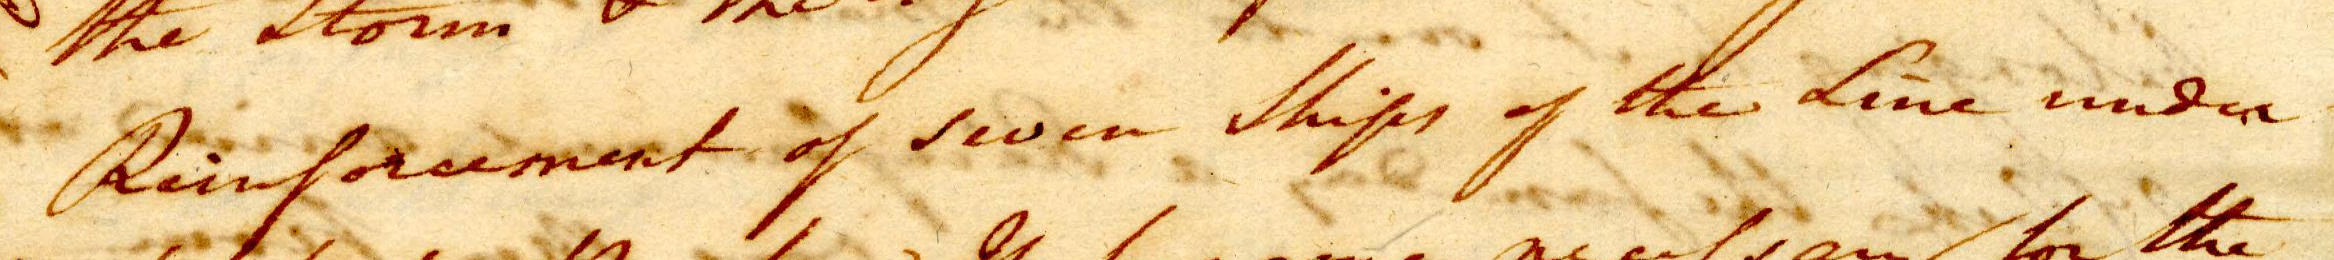Reinforcement of seven Ships of the Line under
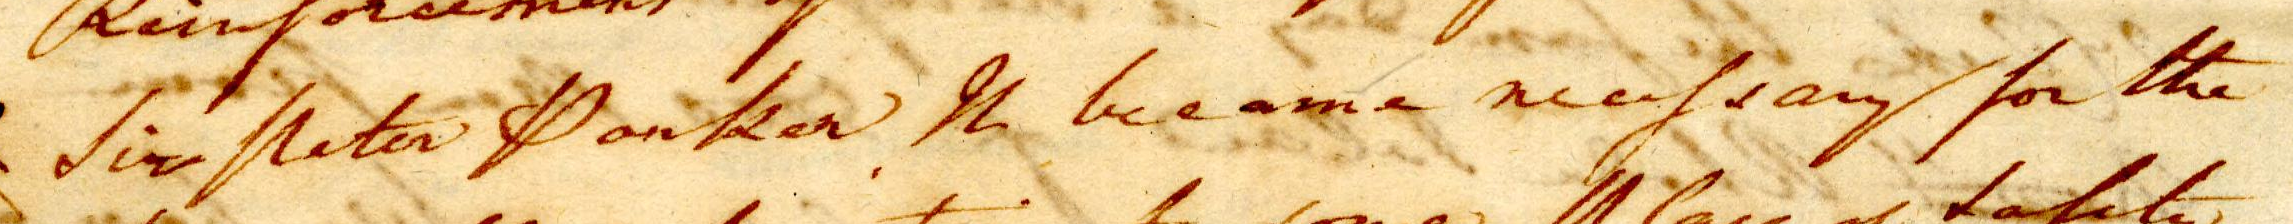Sir Peter Parker It became necessary for the
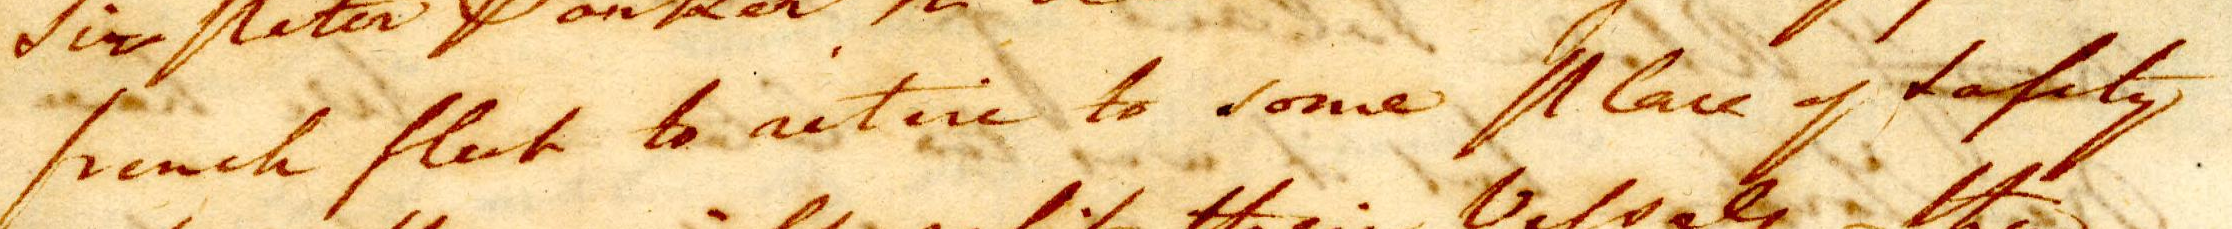French fleet to retire to some place of safety
